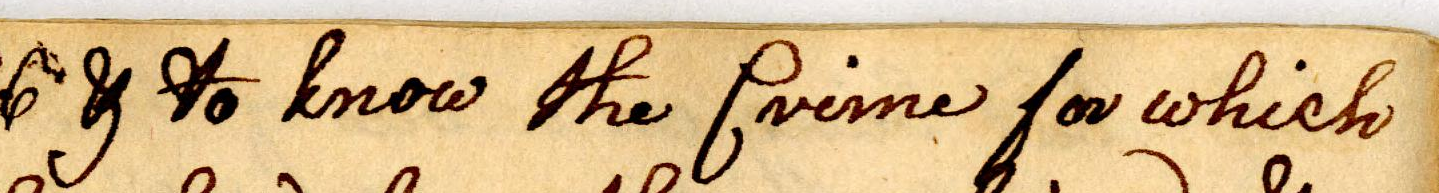& to know the Crime for which
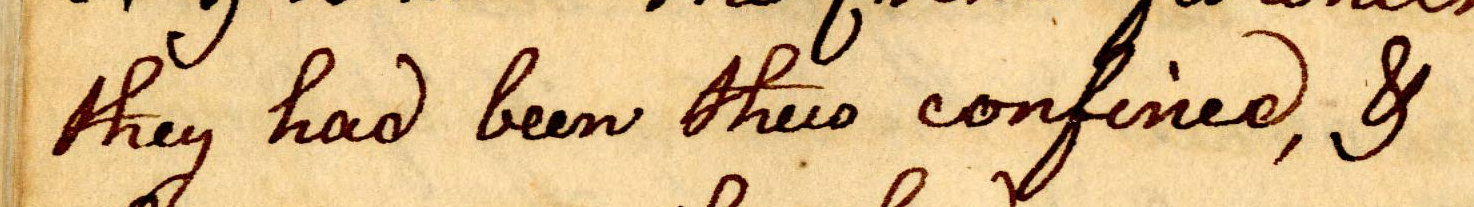they had been thus confined, &
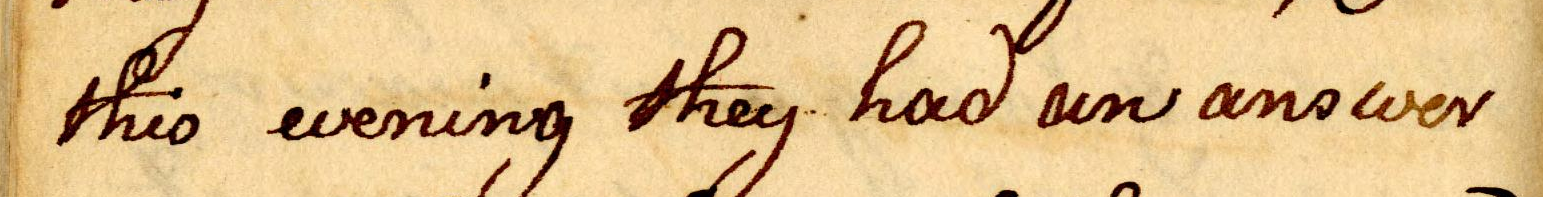this evening they had an answer
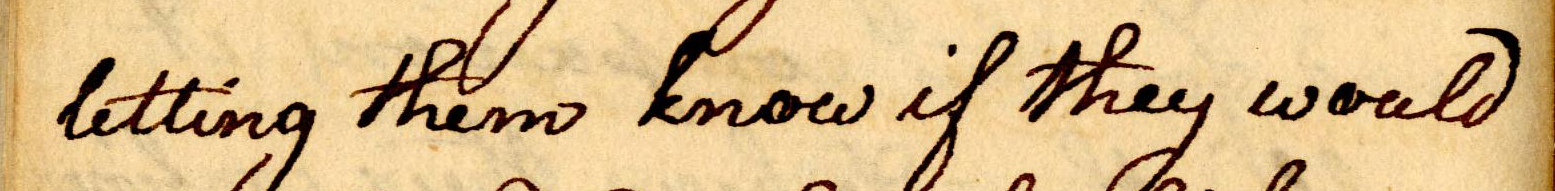letting them know is they would
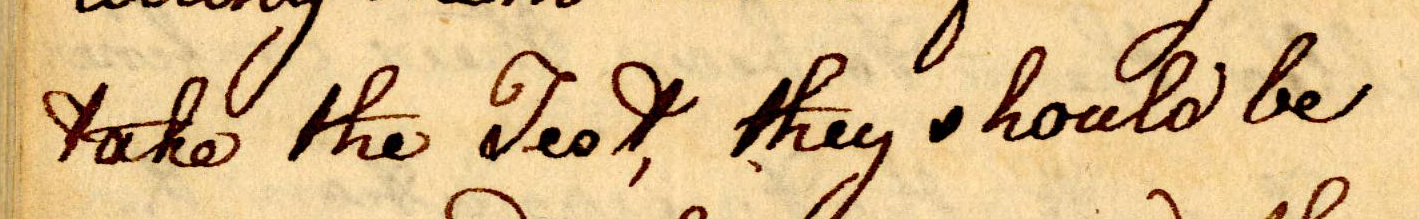take the Test, they should be
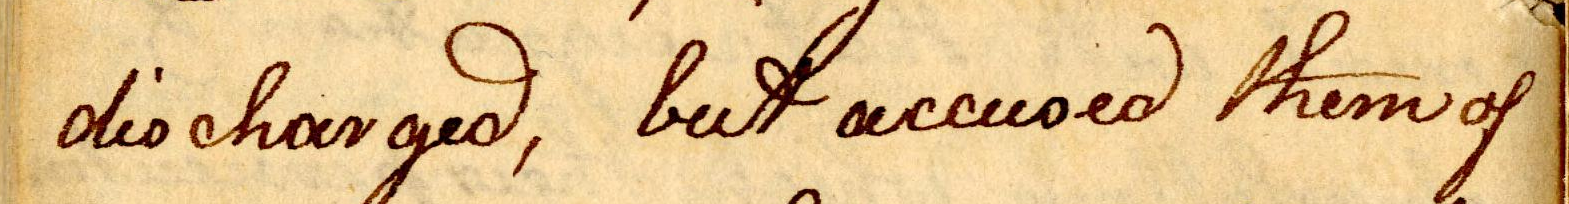discharged, but accused them of
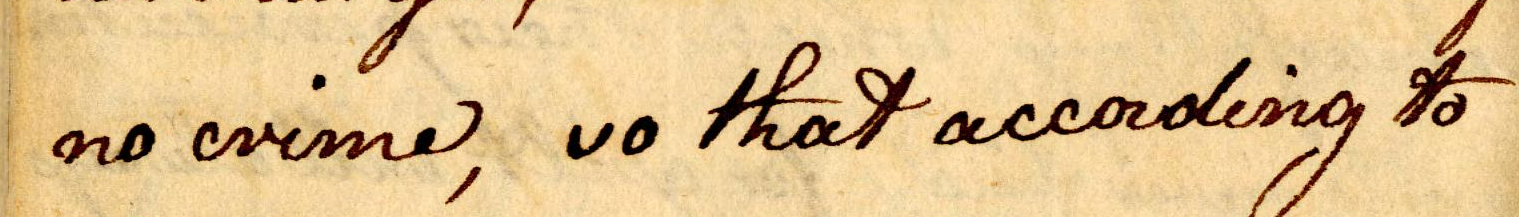no crime, so that according to
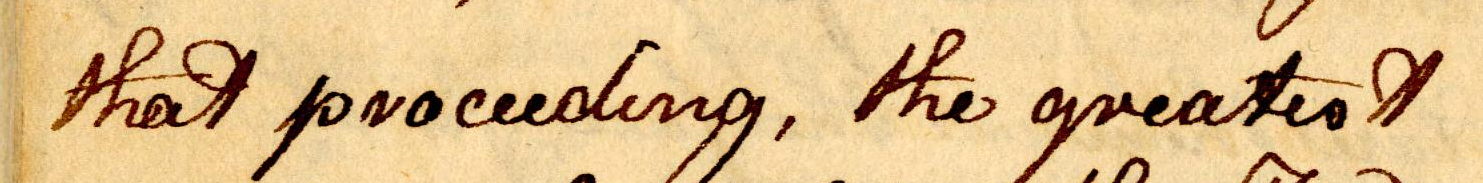that proceeding, the greatest
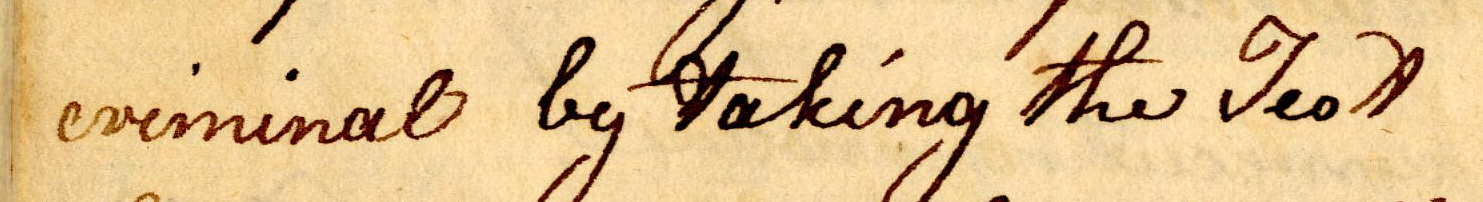criminal by taking the Test
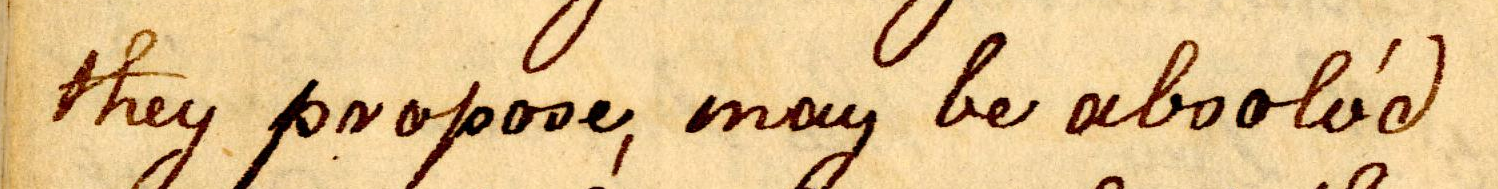they propose, may be absolv'd
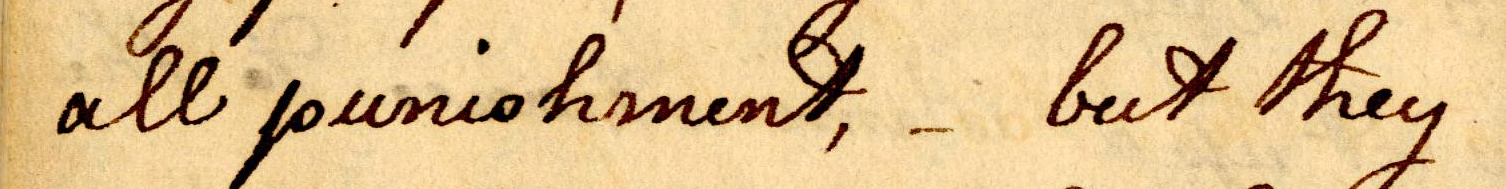all punishment,- but they
